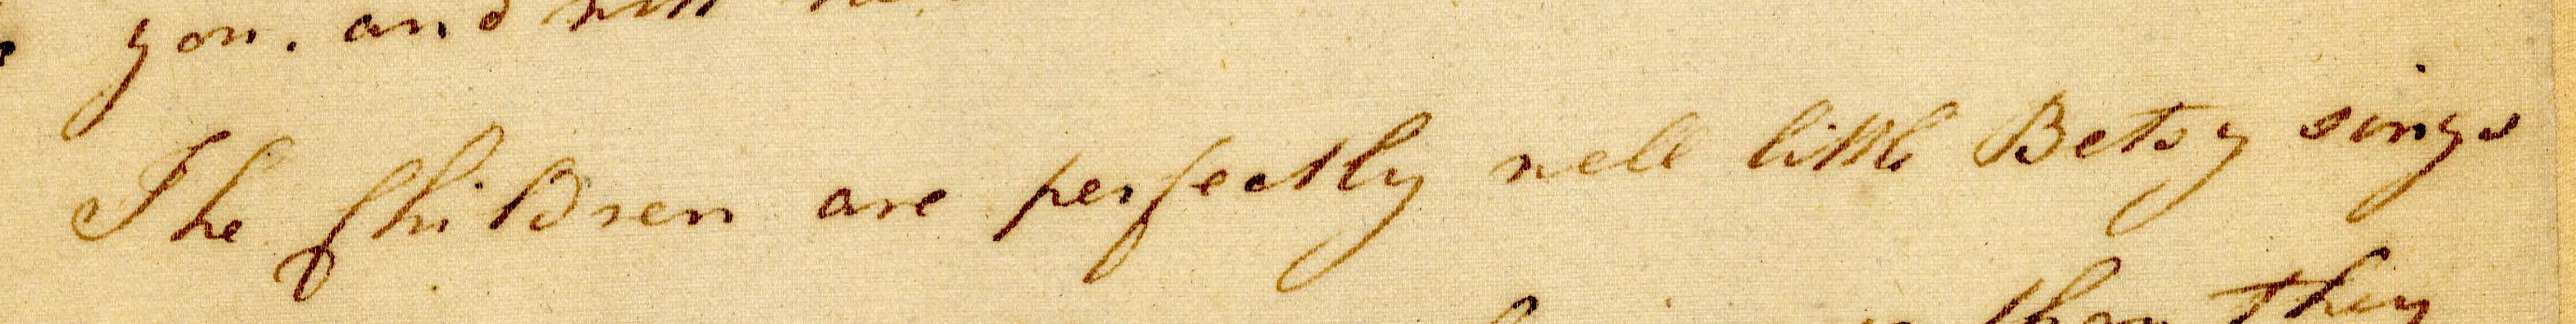The Children are perfectly well little Betsy sings
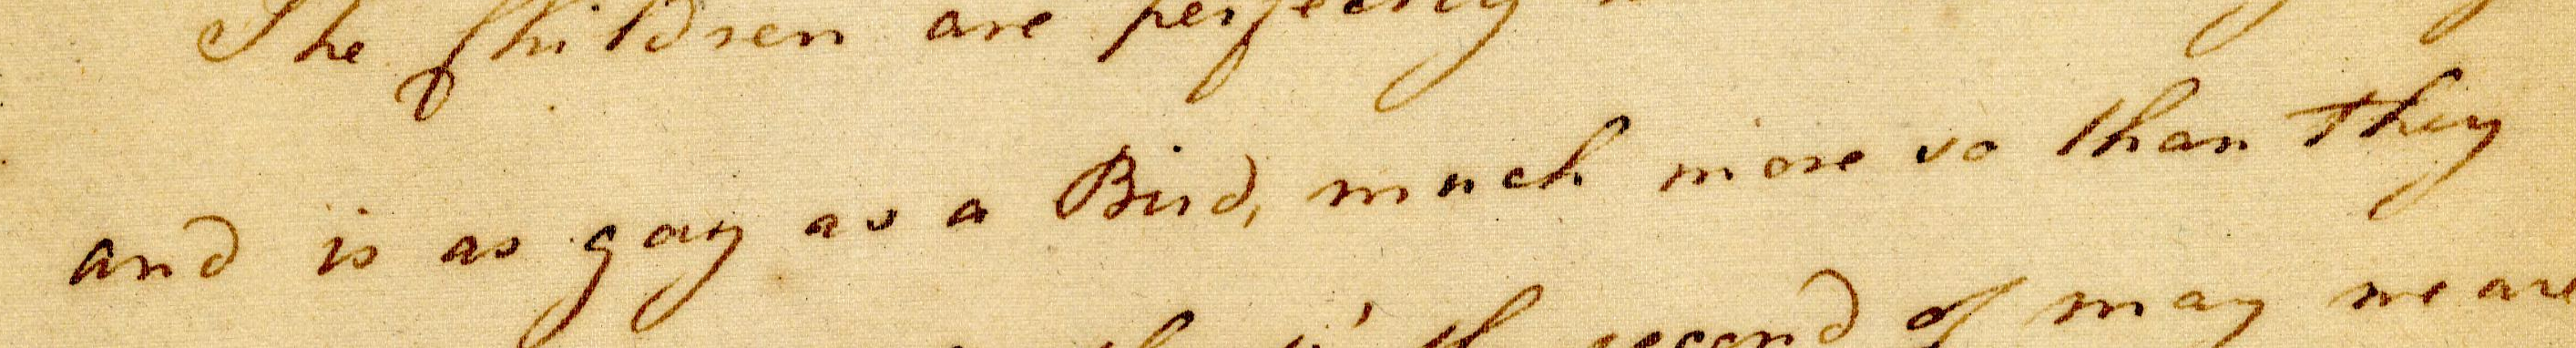and is as gay as a Bird, much more so than they
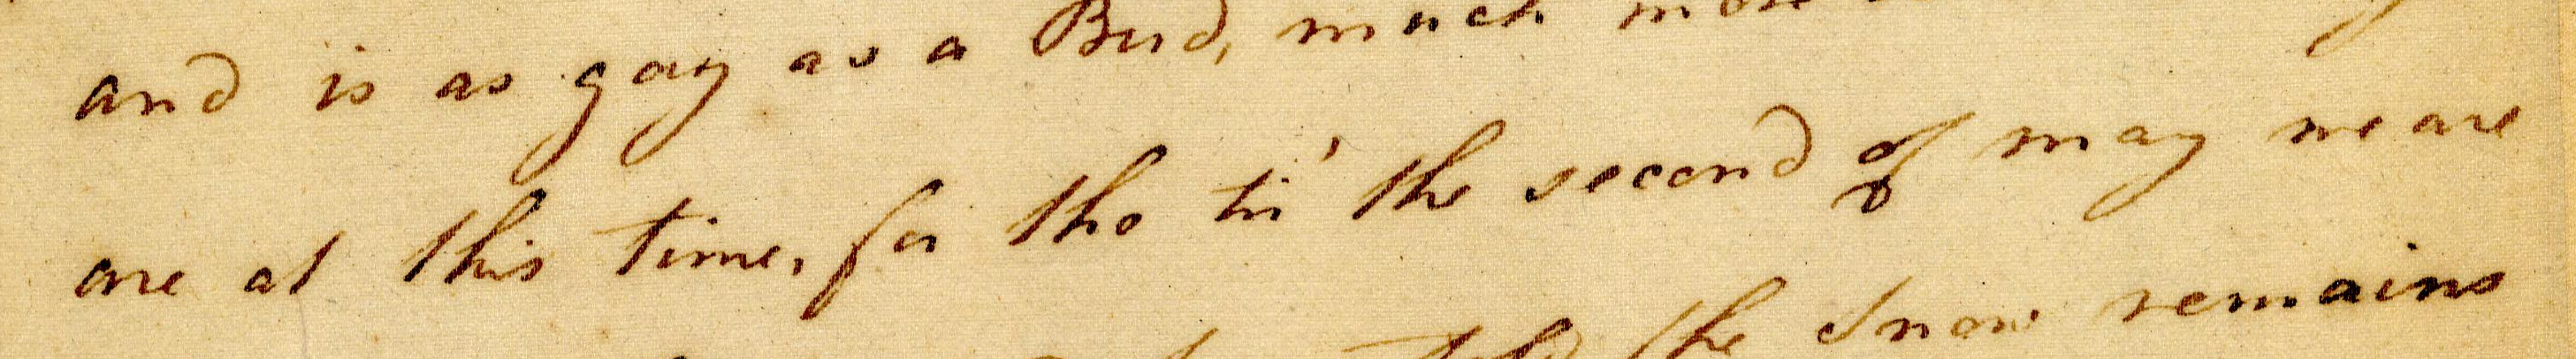are at this time for tho tis' the second of may we are
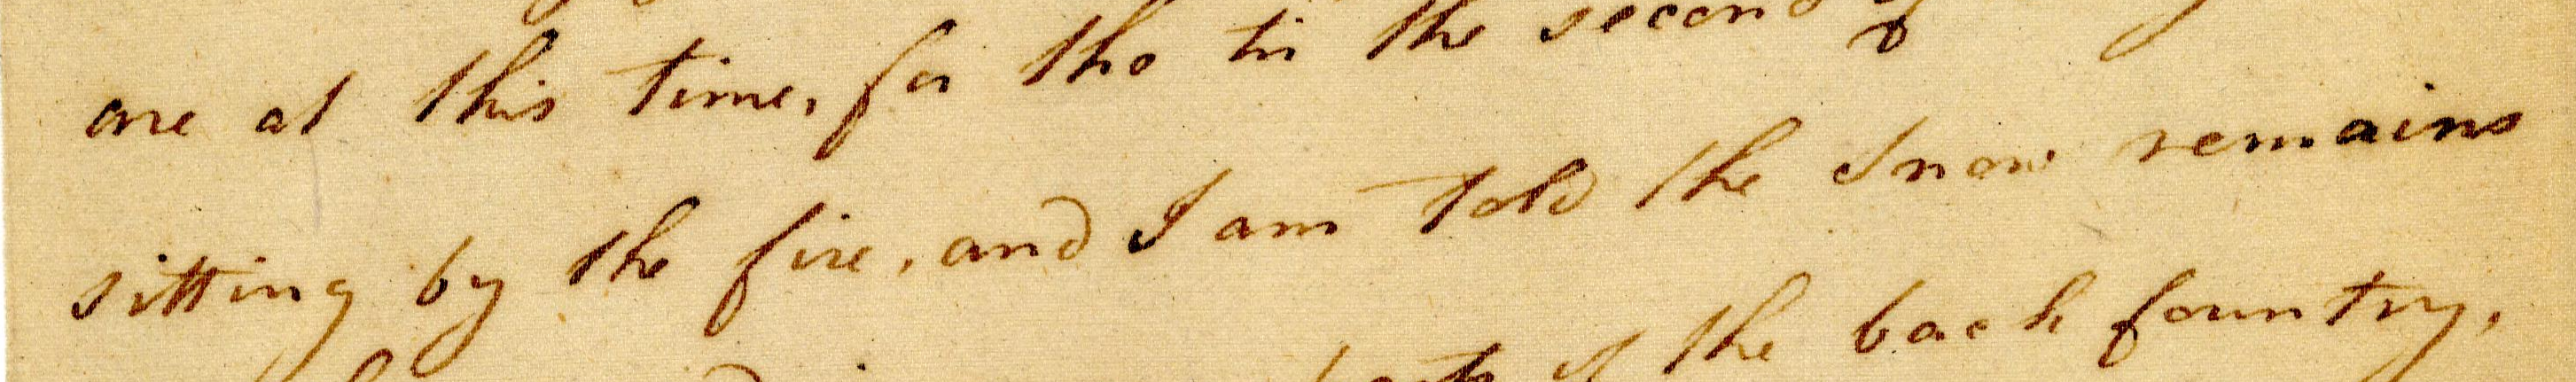sitting by the fire, and I am told the Snow remains
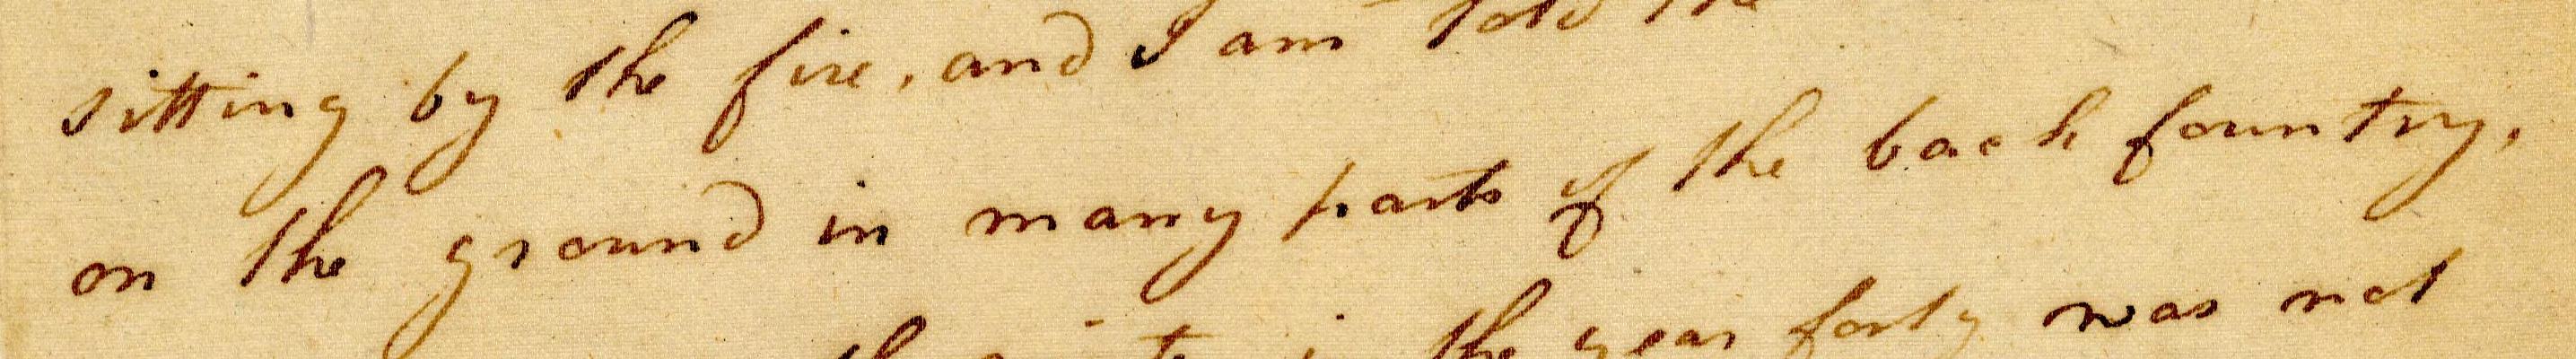on the ground in many parts of the back Country,
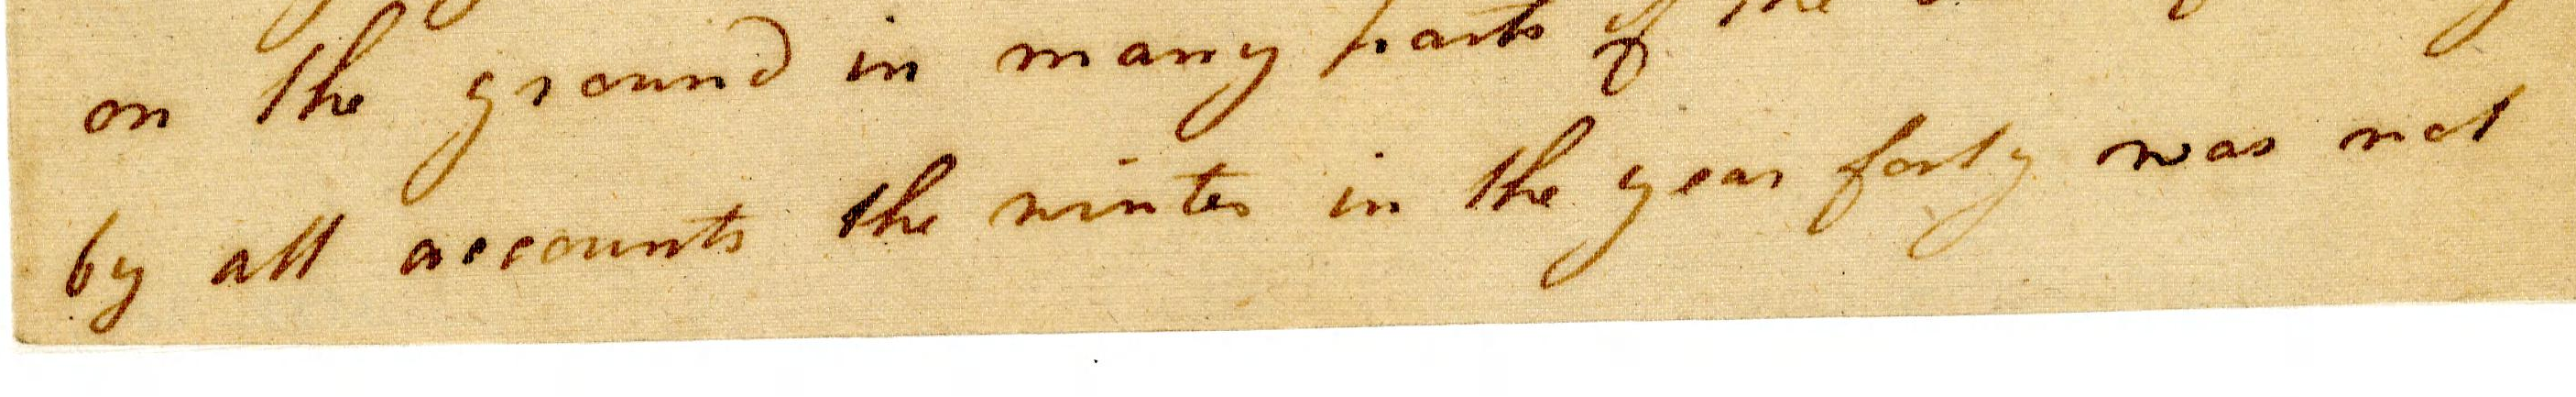by all accounts the winter in the year forty was not
